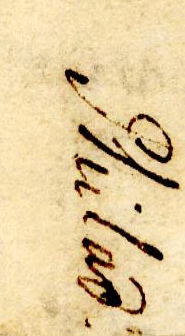Philad.
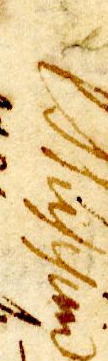E. Shippen
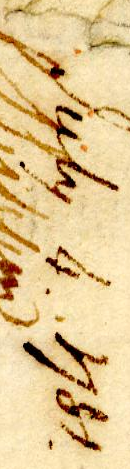July 4. 1781.
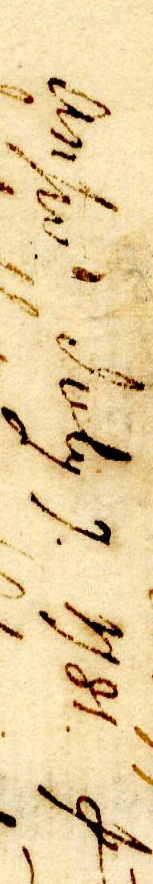Answ^d. July 7. 1781 per
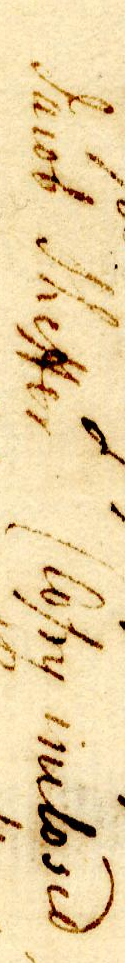Jacob Sheffer (Copy inclosed
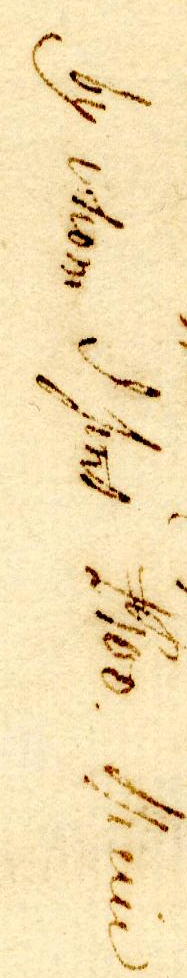by whom I sent £100. Specie
